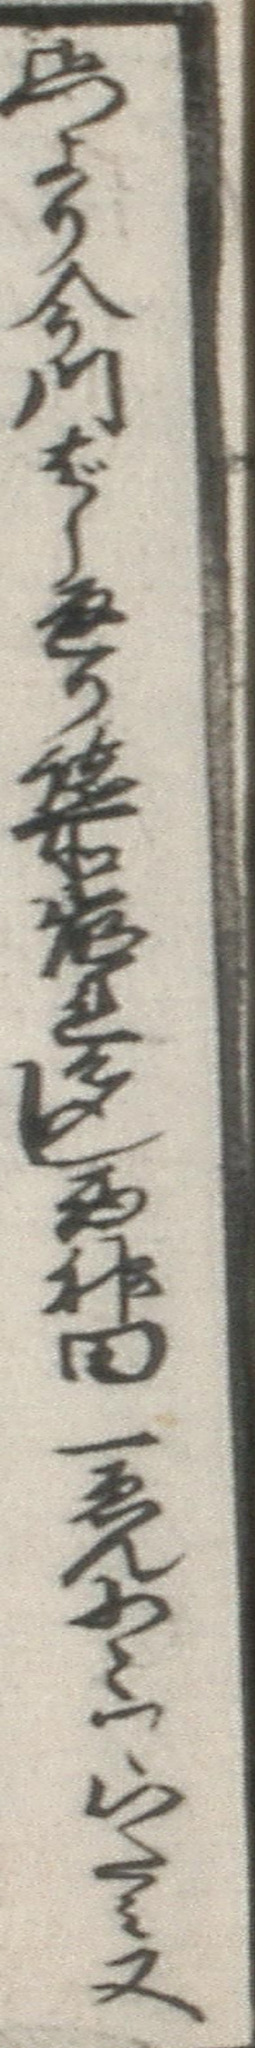御門より今川ばし通り諸所崩れ多し西神田一ゑん少々ツヽいたミ又
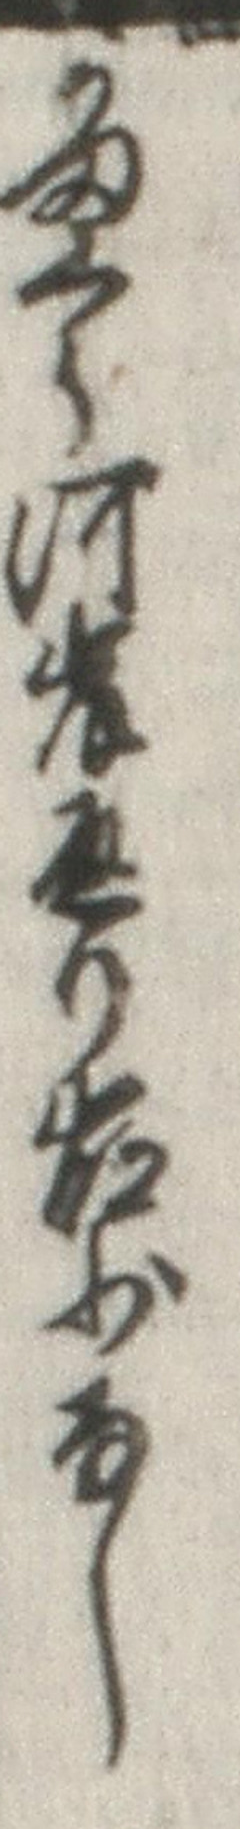かまくら河岸通り崩少なし
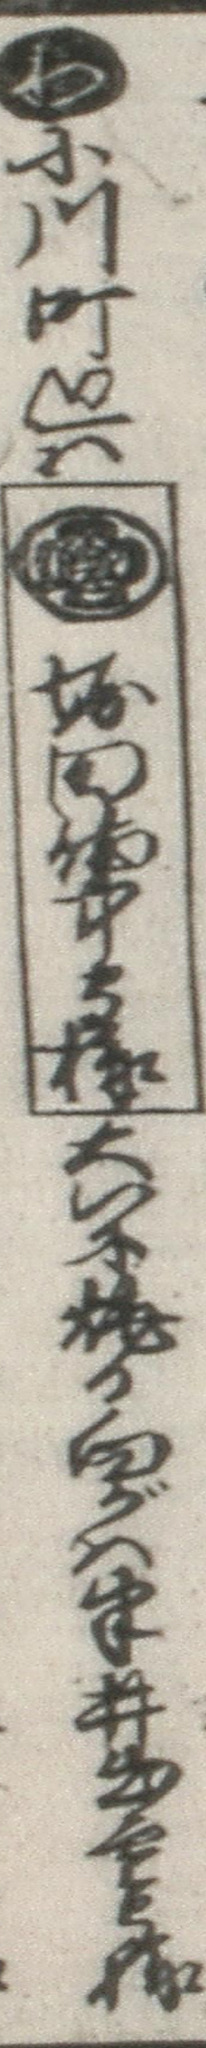わ小川町辺ハ堀田備中守様大いに焼る向がハ半井出雲守様
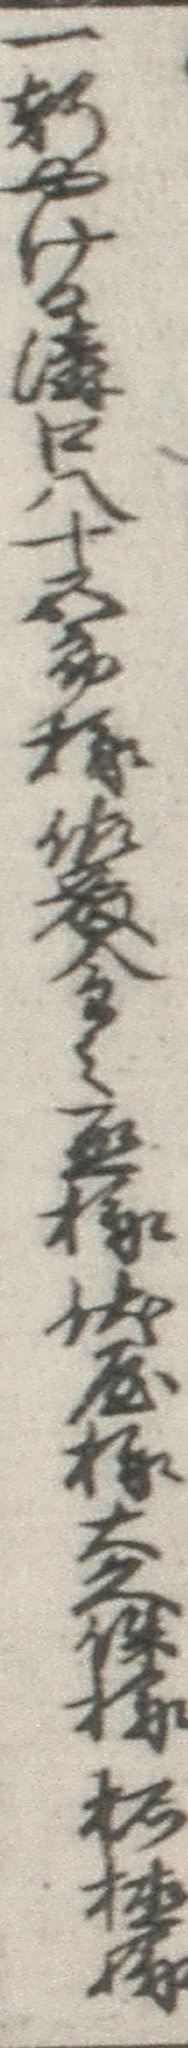一軒やける溝口八十五郎様佐藤金之烝様伏屋様大久保様柘植様
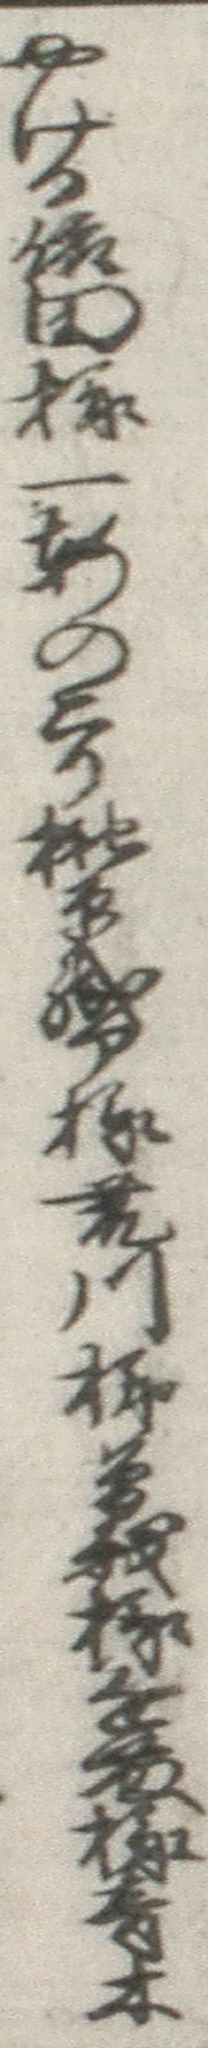やける依田様一軒のこり榊原織部様荒川様曾我様近藤様青木
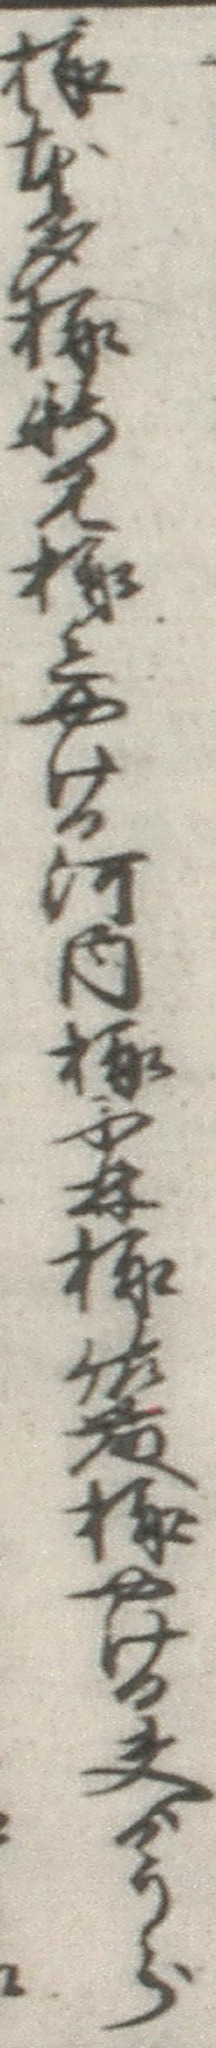様本多様新見様迄やける河内様小林様佐藤様やける夫ゟうら
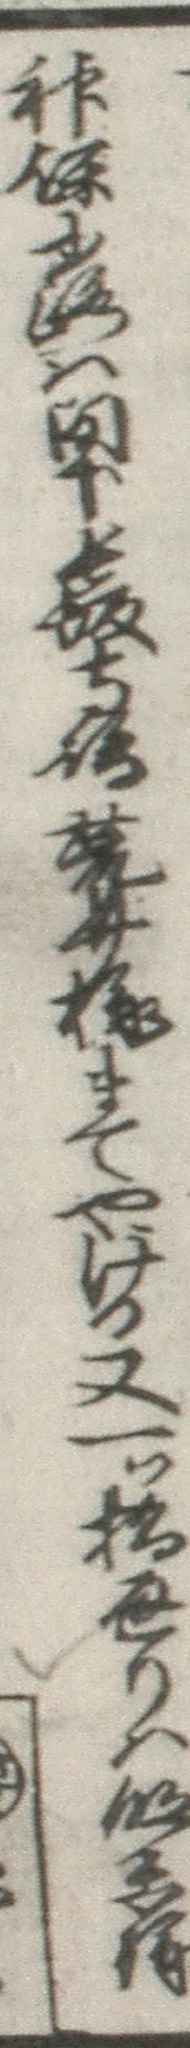神保小路ハ間下長坂寺島荒井様まてやける又一ツ橋通りハ明楽様
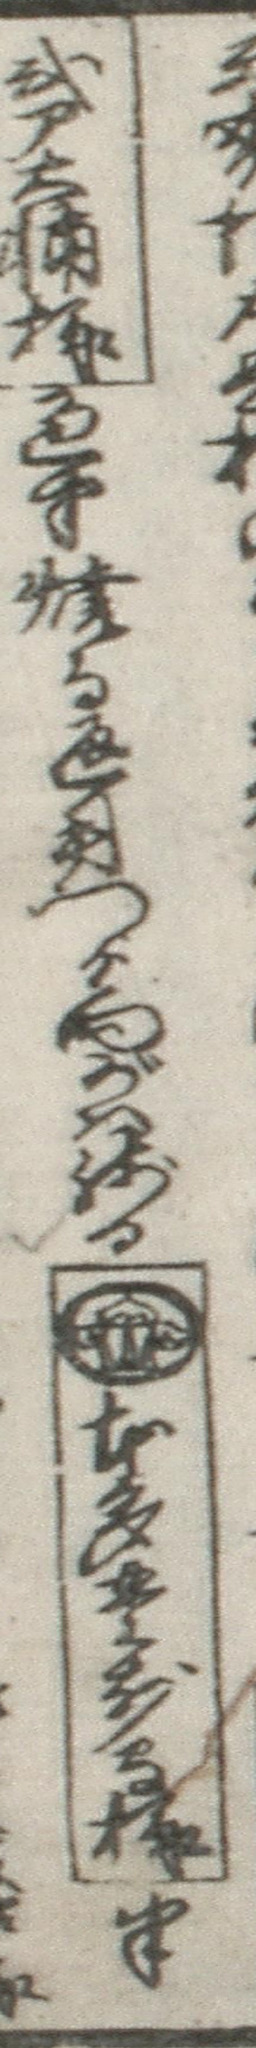式部大輔様過半焼る通用門ゟ向がハ残る本多豊前守様半
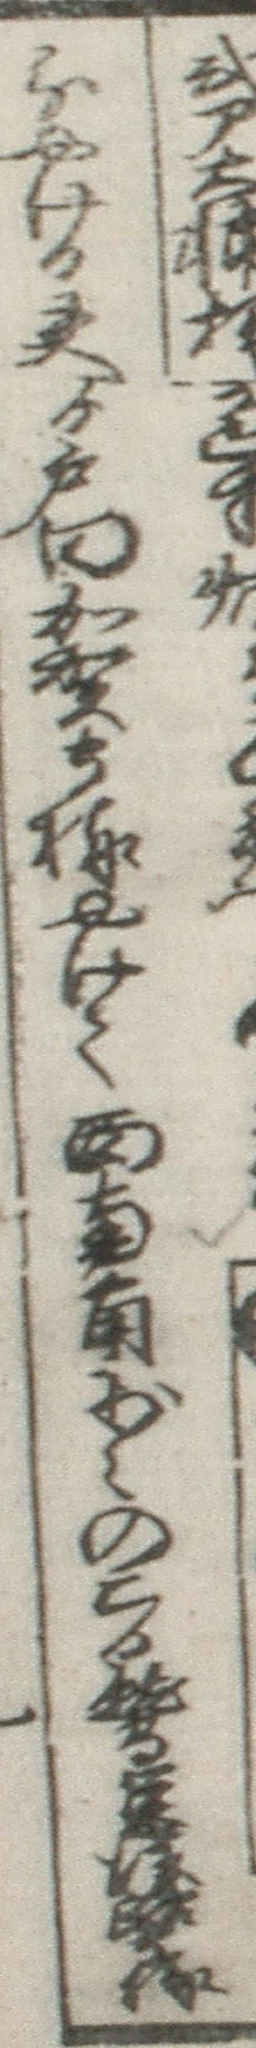分やける夫ゟ戸田加賀守様やけて西南角少しのこる鷲巣淡路守様

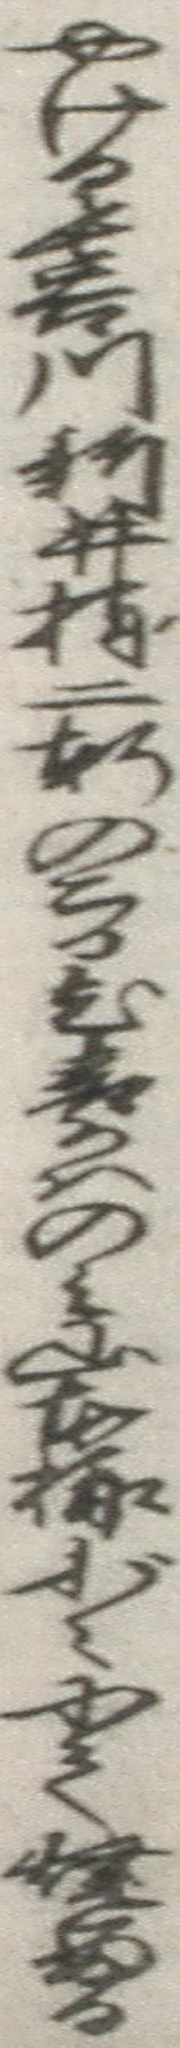やける長谷川新井様二軒のこる尤表かはのみ山本様少〻にて焼留る
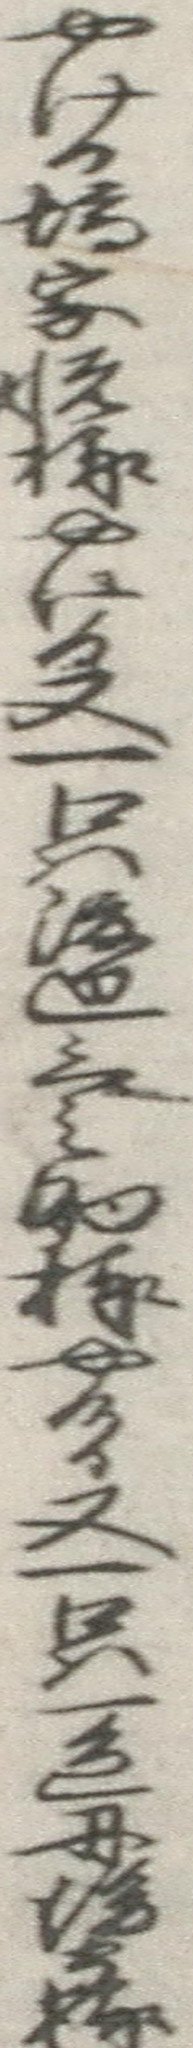やける塙宗悦様やける又一口は渡辺三之助様やける又一口は一色丹後守様
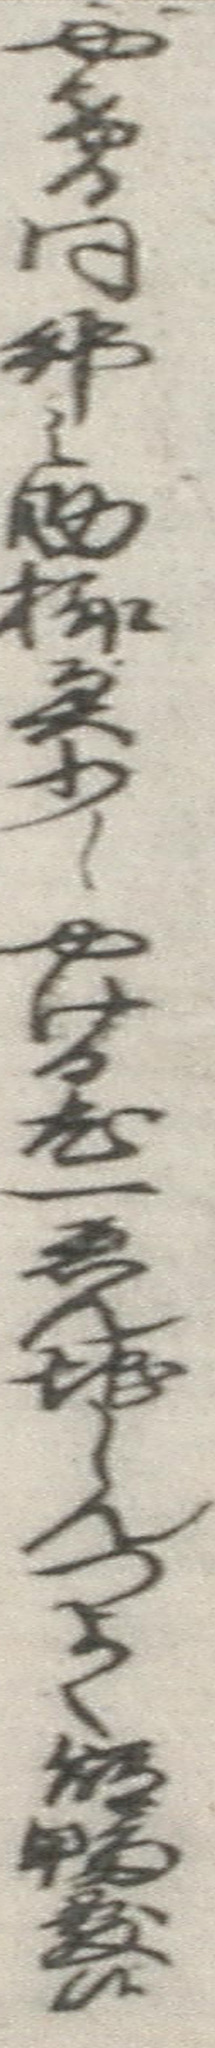やける同邦之助様奥少しやける尤一ゑん地しんつよく崩夥敷候
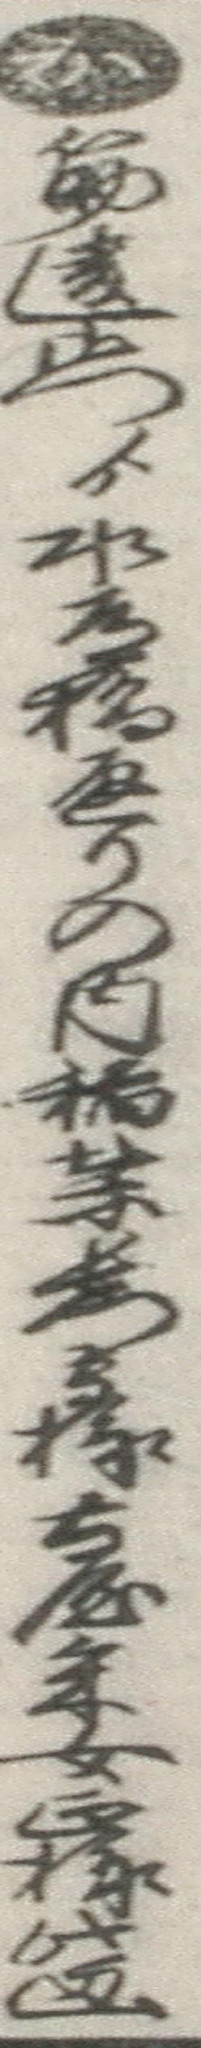か筋違御門ゟ水道橋通りの内稲葉長門守様土屋采女正様此辺
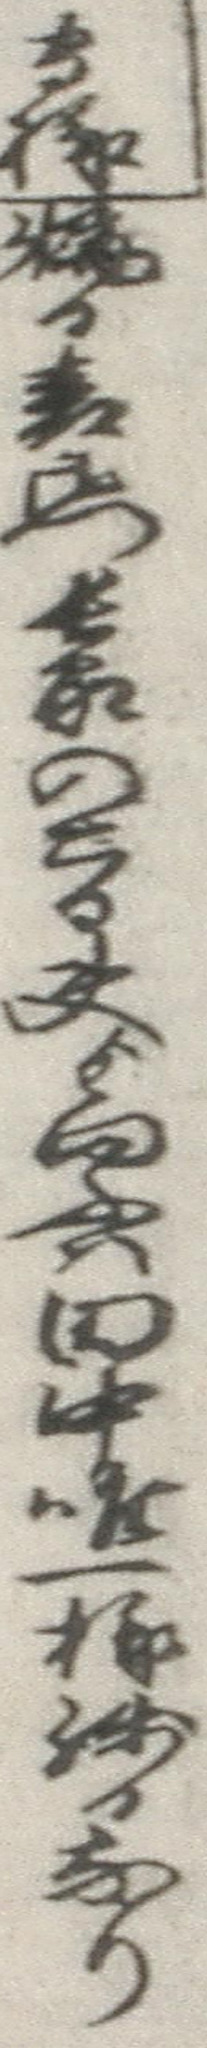守様焼る表御門長家のこる夫ゟ向ふは田中唯一様残るなり
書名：大地震焼場細見記
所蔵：東京大学地震研究所図書室 Earthquake Research Institute Library, The University of Tokyo, JAPAN
